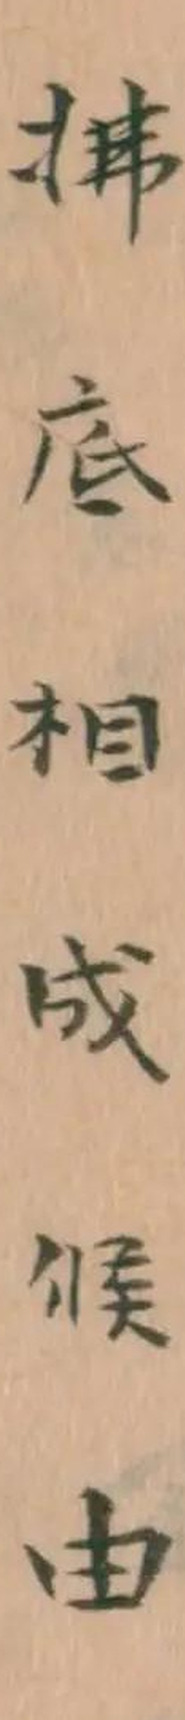払底相成候由
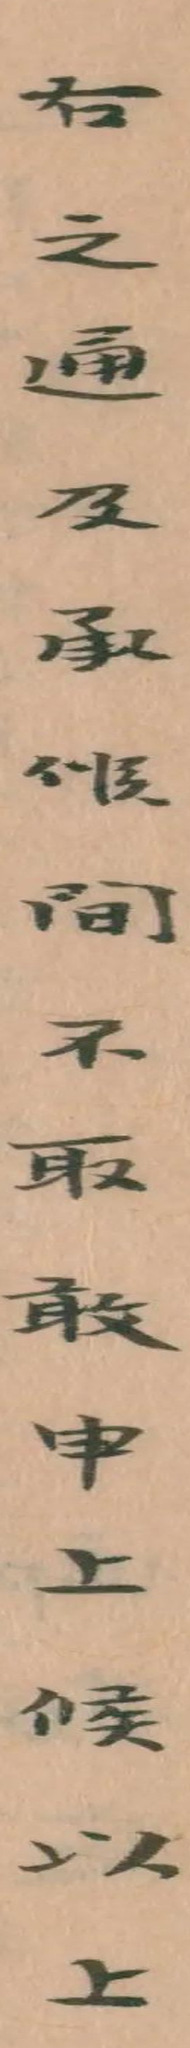右之通及承候間不取敢申上候以上
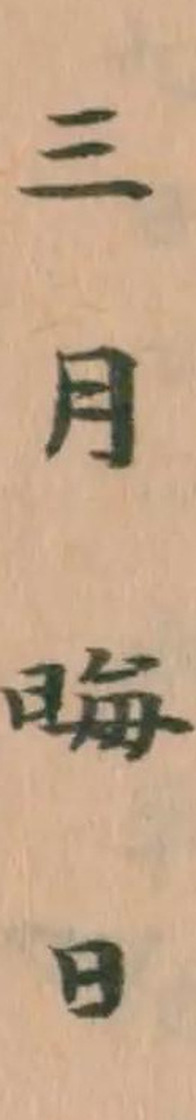三月晦日
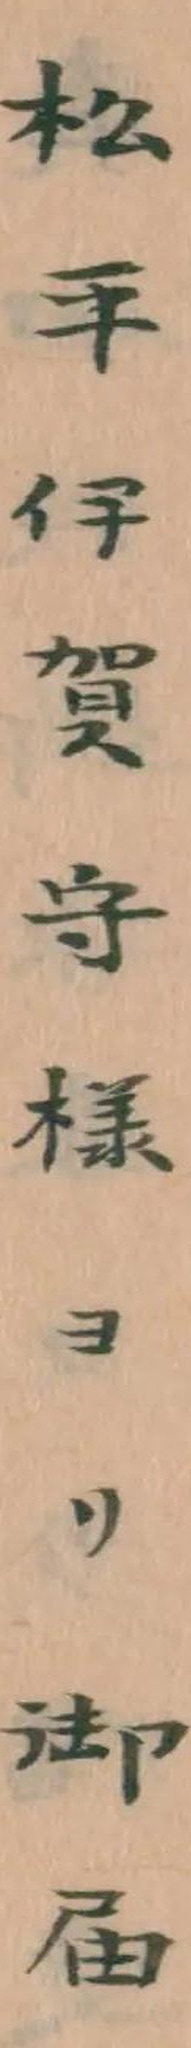松平伊賀守様ヨリ御届
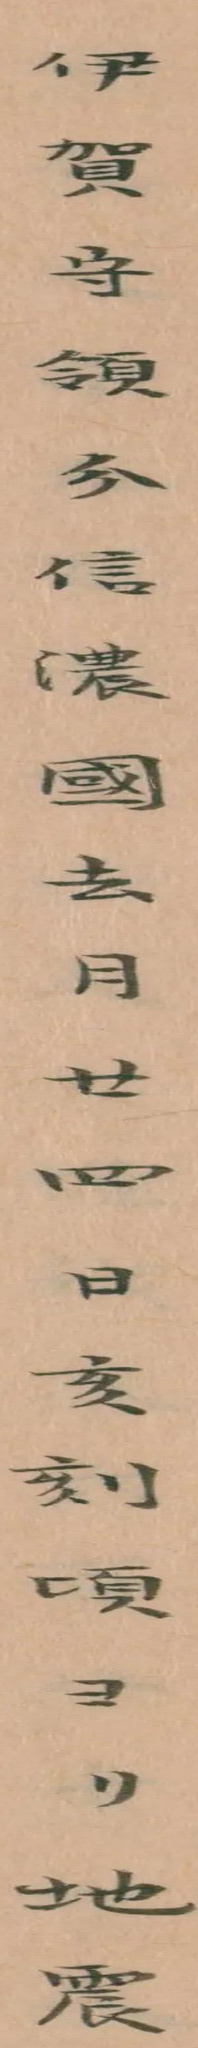伊賀守領分信濃国去月廿四日亥刻頃ヨリ地震
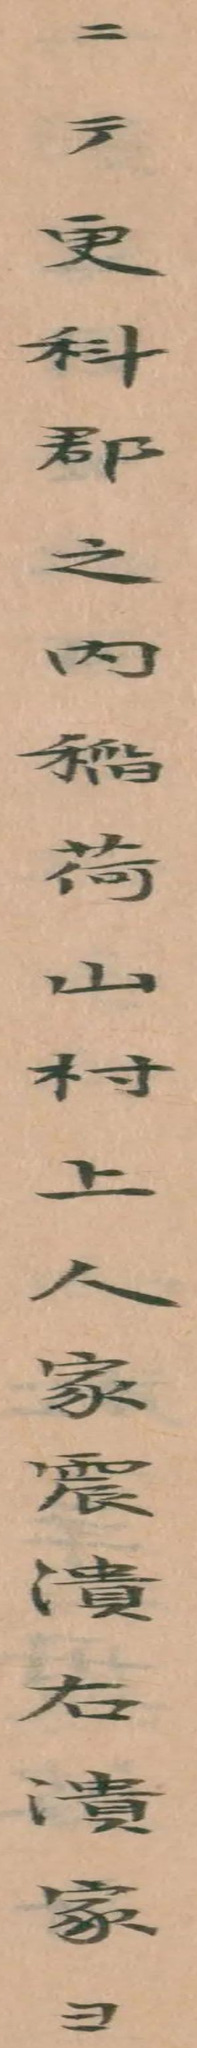ニテ更科郡之内稲荷山村上人家震潰右潰屋ヨ
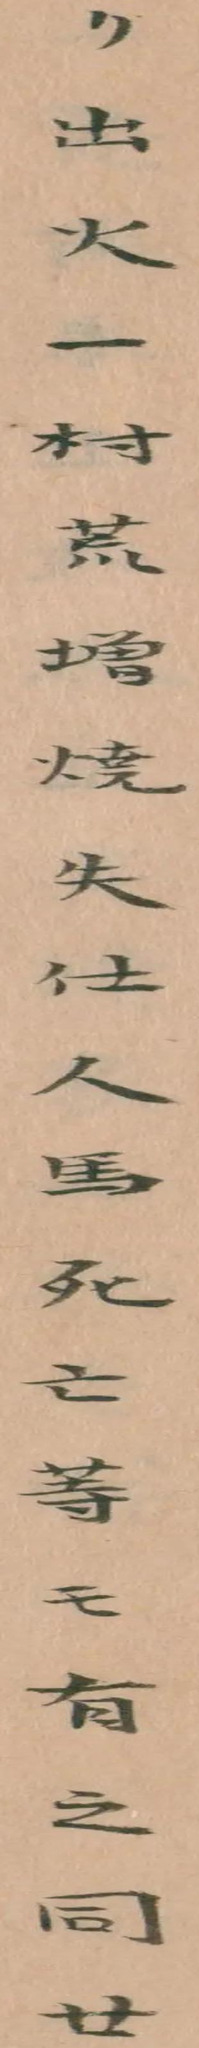リ出火一村荒増焼失仕人馬死亡等モ有之同廿
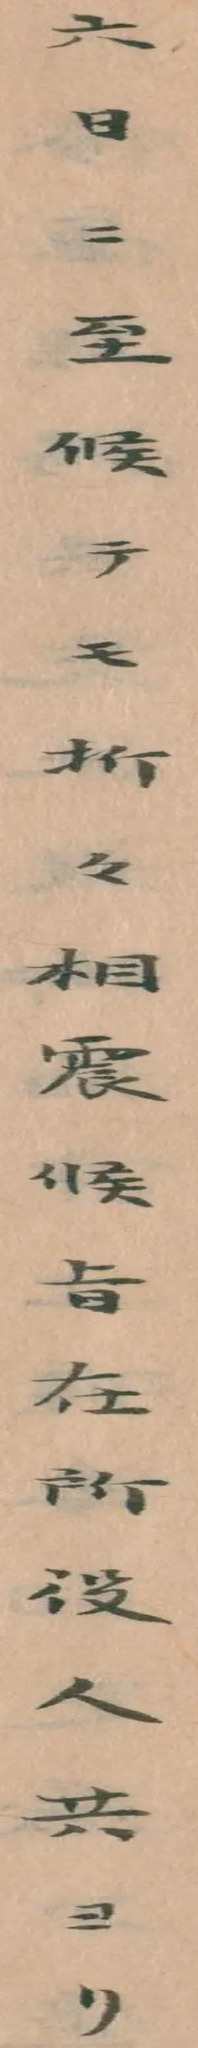六日に至候テモ折々相震候旨在所役人共ヨリ
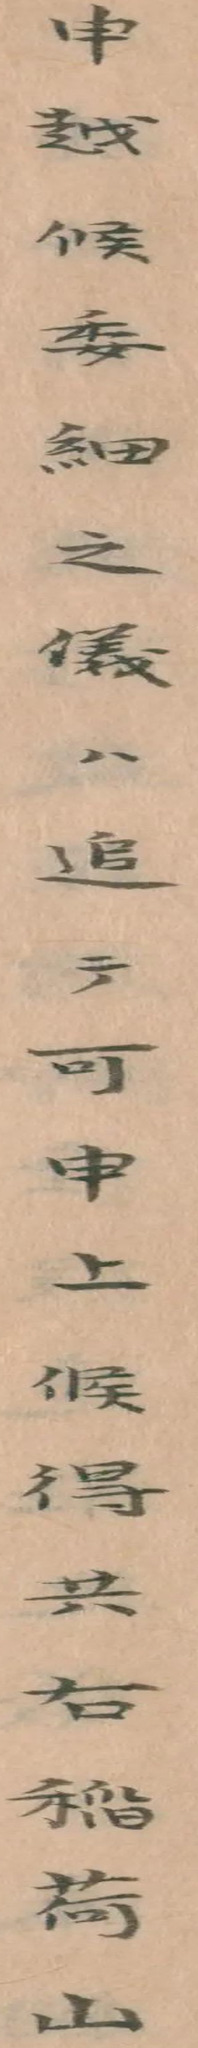申越候委細之儀ハ追テ可申上候得共右稲荷山
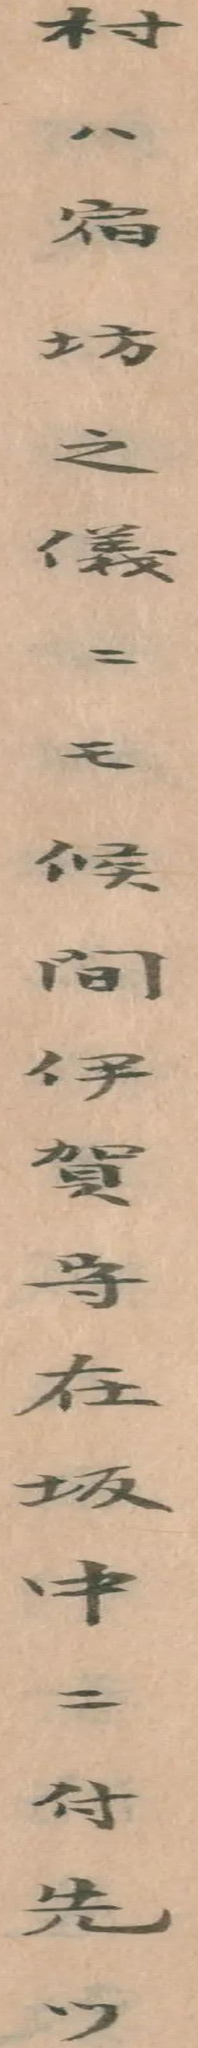村ハ宿坊之儀ニモ候間伊賀守在坂中二付先ッ
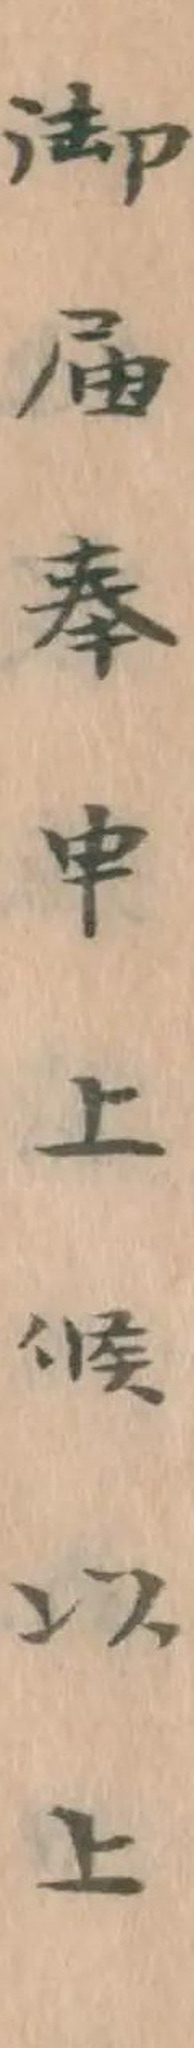御届奉申上候以上
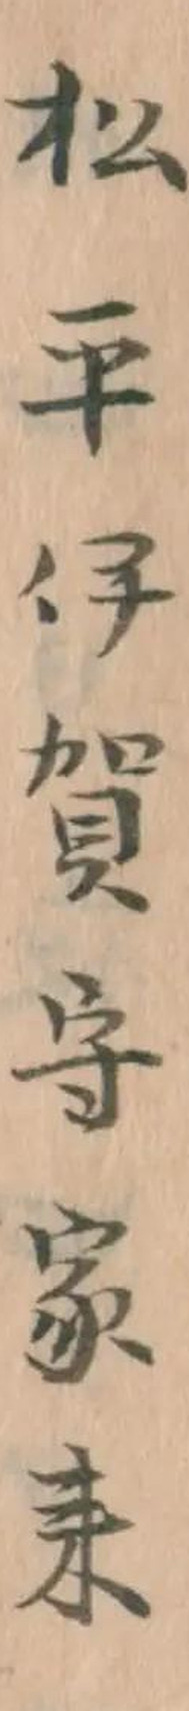松平伊賀守家来

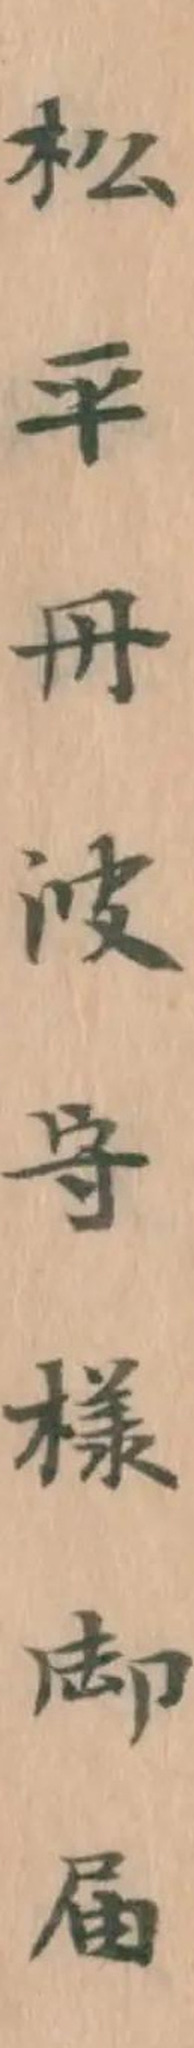松平丹波守様御届
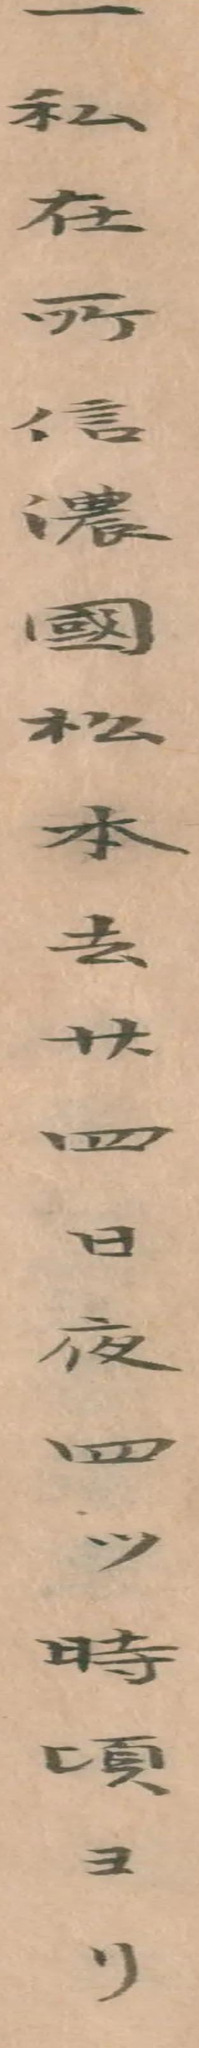一私在所信濃国松本去廿四日夜四ッ時頃ヨリ
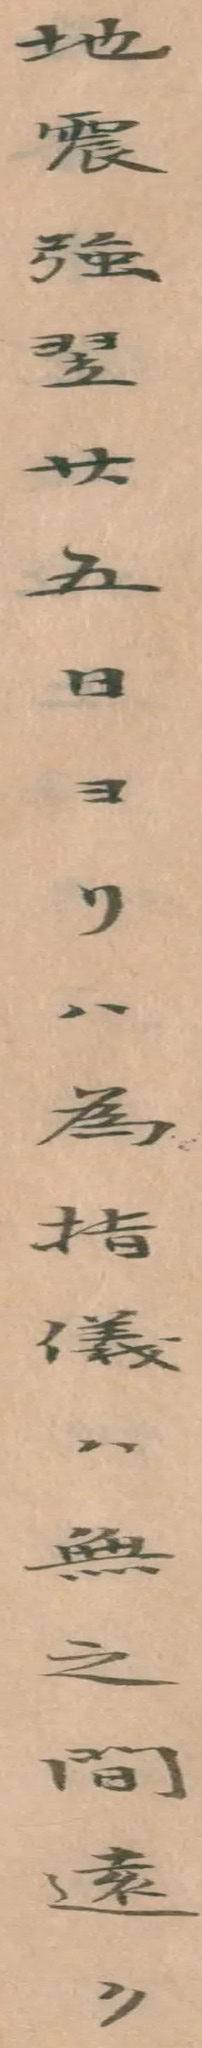地震強翌廿五日ヨリハ為指儀ハ無之間遠ク
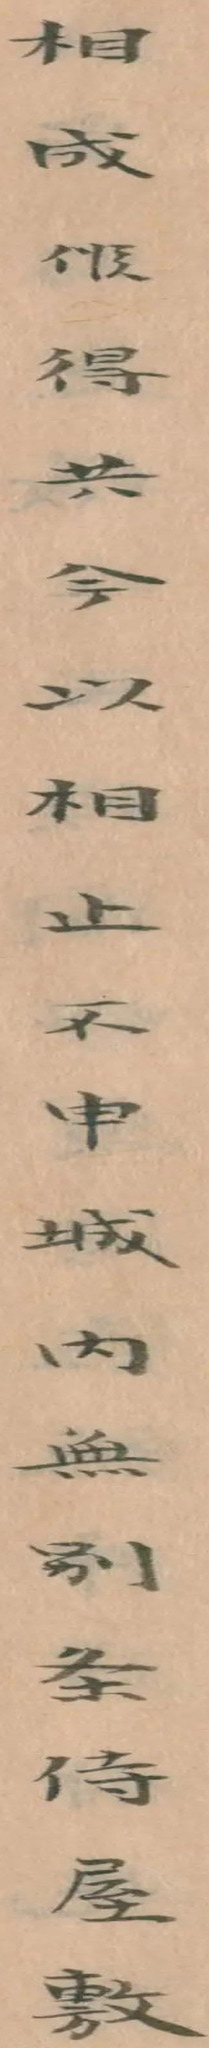相成候得共今以相止不申城内無別条侍屋敷
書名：地災撮要. 巻1(噴火山・地震ノ部)
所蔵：国立国会図書館 National Diet Library, JAPAN
